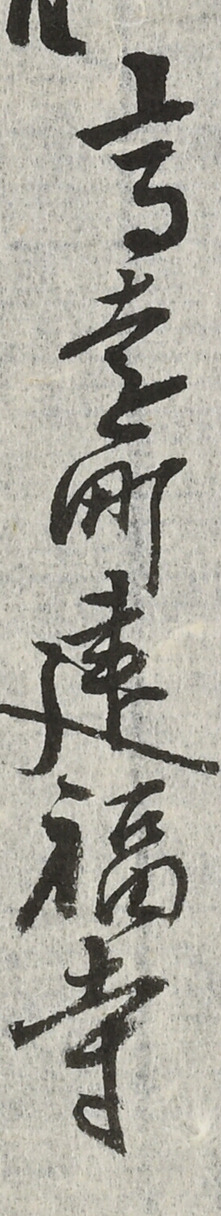高遠町建福寺
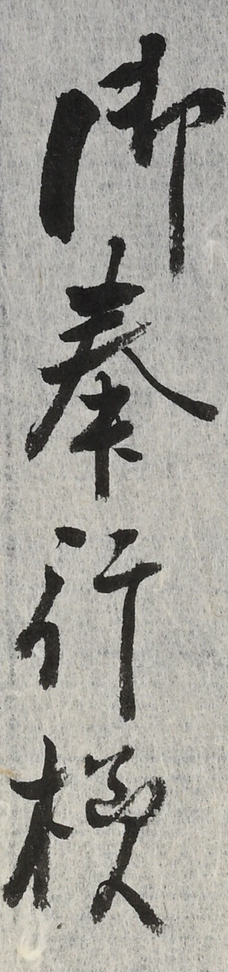御奉行様

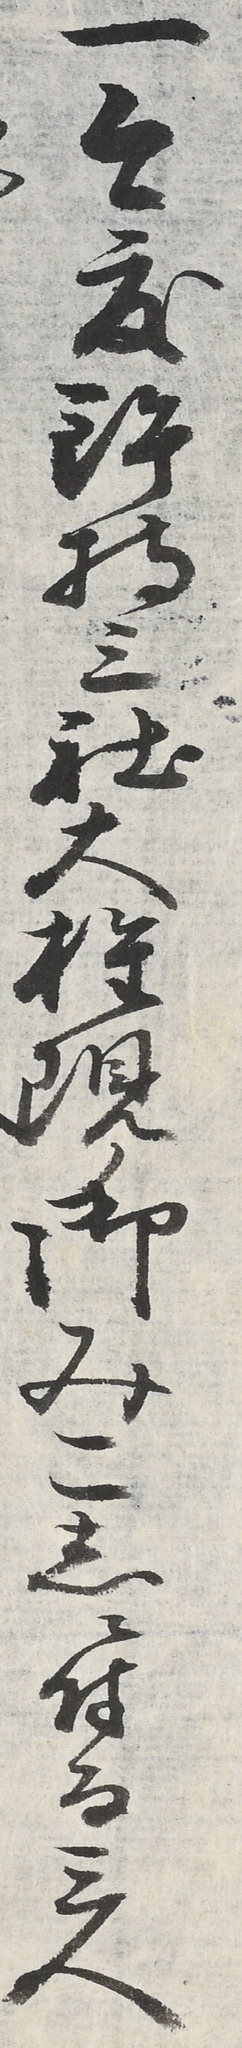一今度鉾持三社大権現御みこしニ付而三人
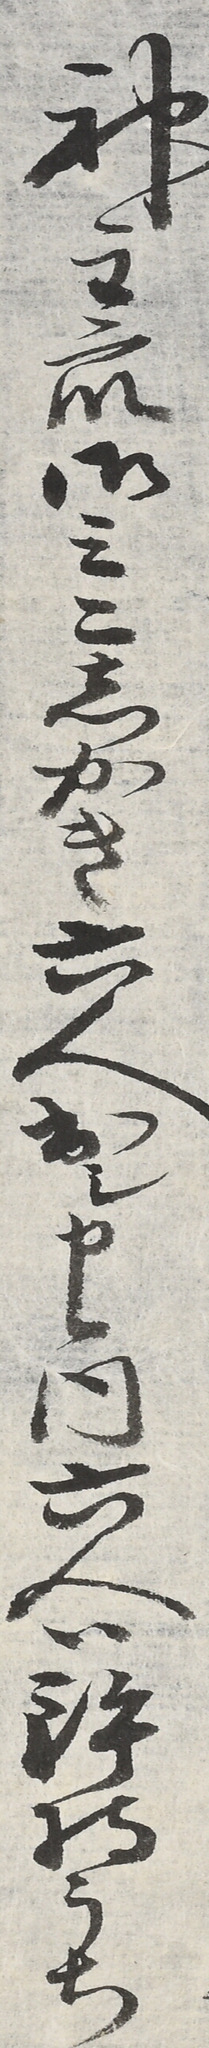神主衆御ミこしかき六人出シ申候内六人ハ鉾持うち
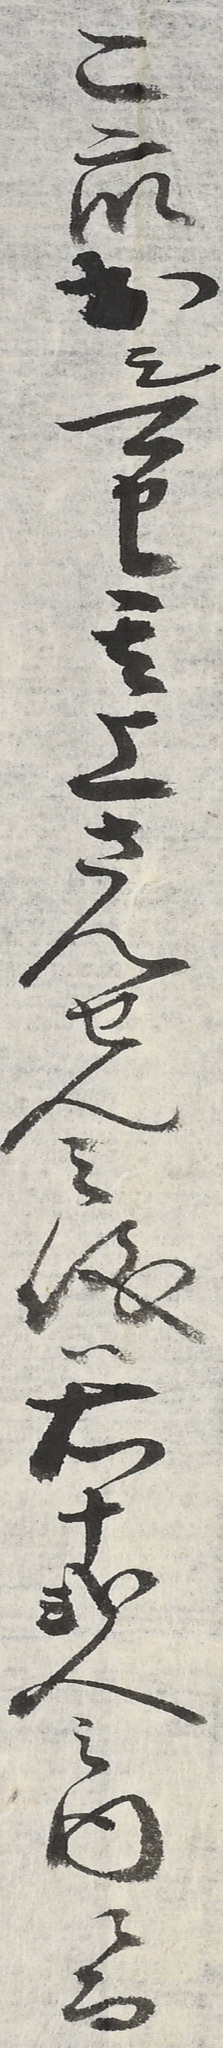こ衆出シ可申候其上さんせん之儀ハ右十弐人之内ニ而
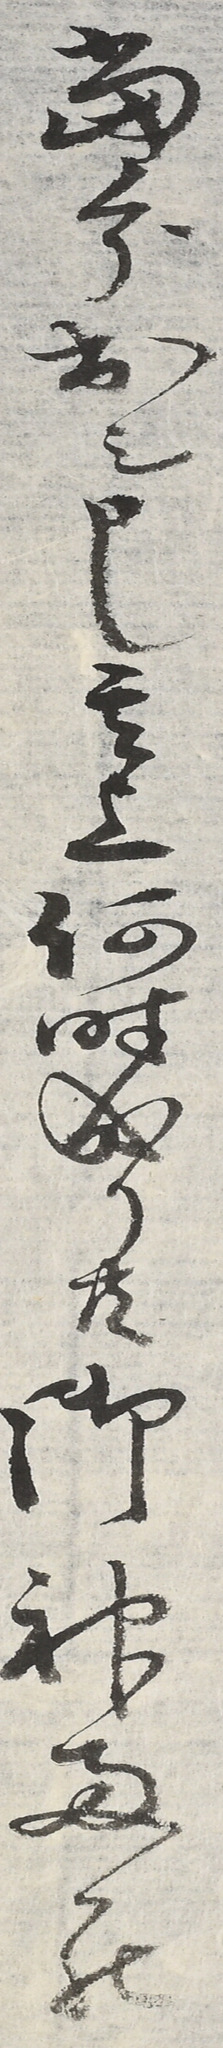当分出シ申候其上何時成り共御神両罷
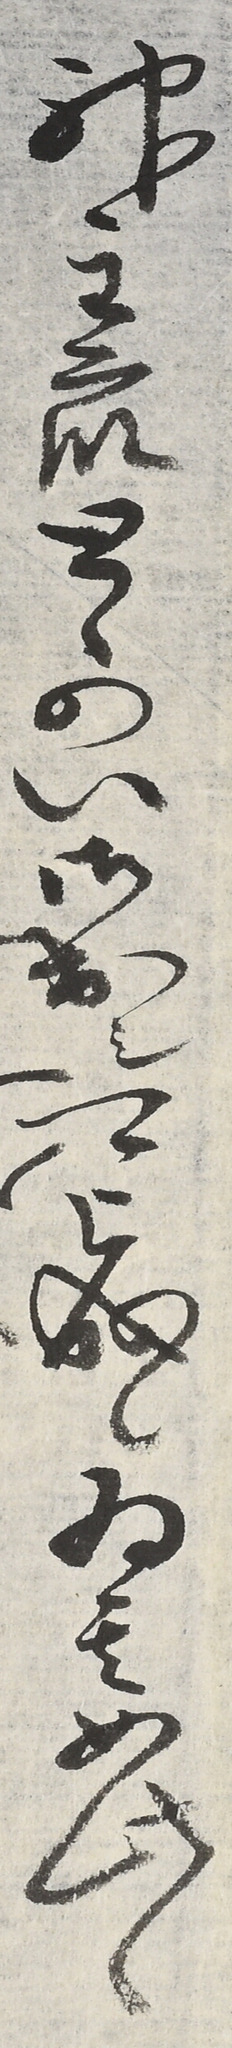神主衆とゝのい御出シ可被成候為其如此候
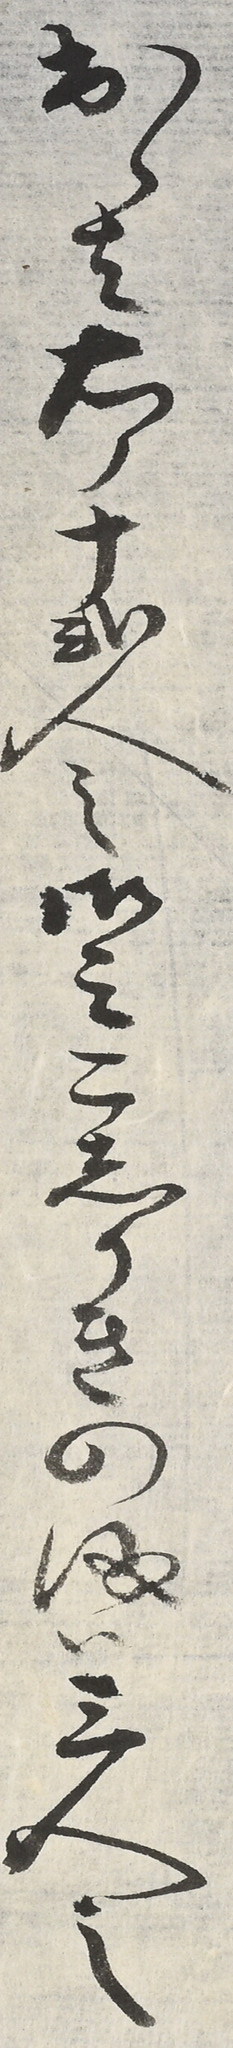出候者右ノ十弐人之御ミこしかきの儀ハ三人之
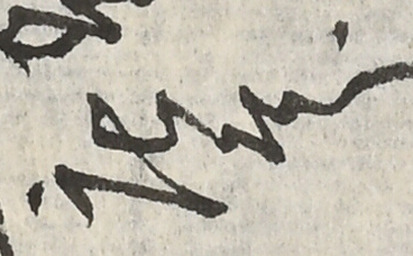長兵衛
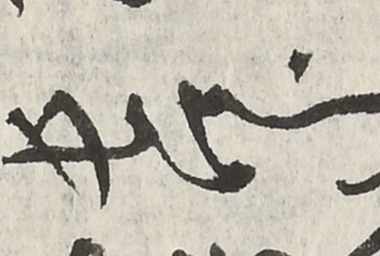長次郎
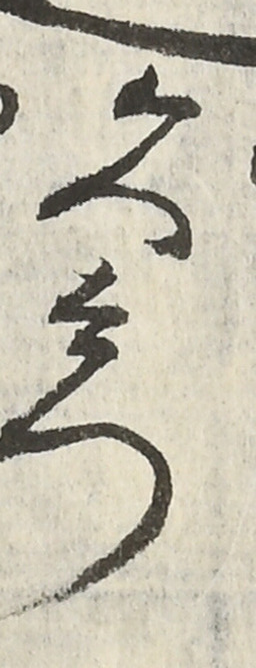長兵衛
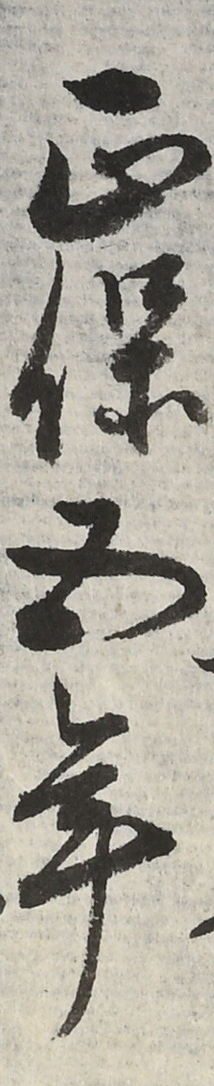正保五年
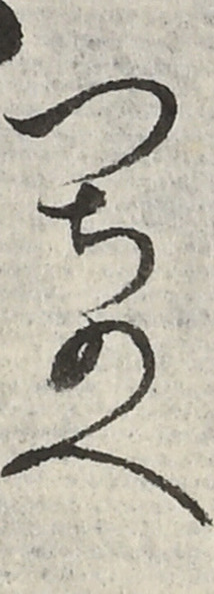つちのへ
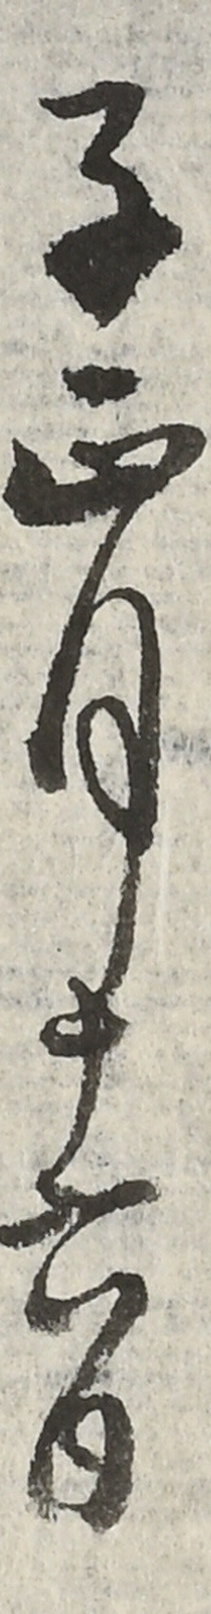子正月十六日
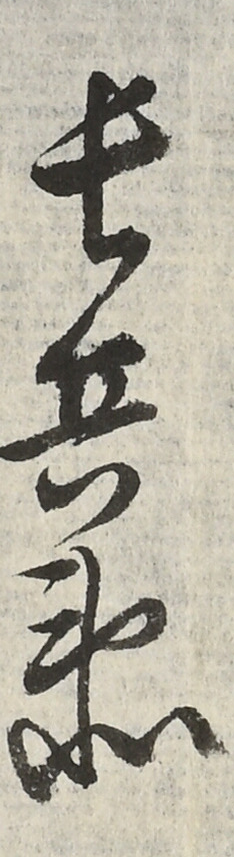長兵衛
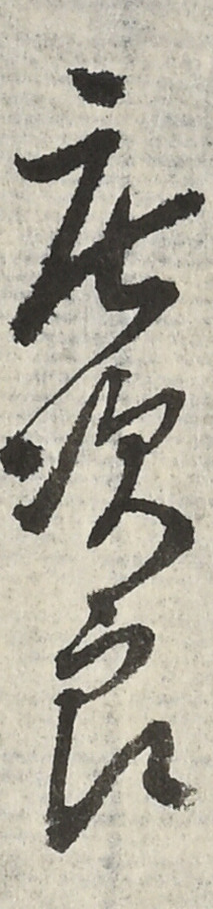庄次郎
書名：旧記
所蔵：伊那市立高遠町図書館・合同会社AMANE
